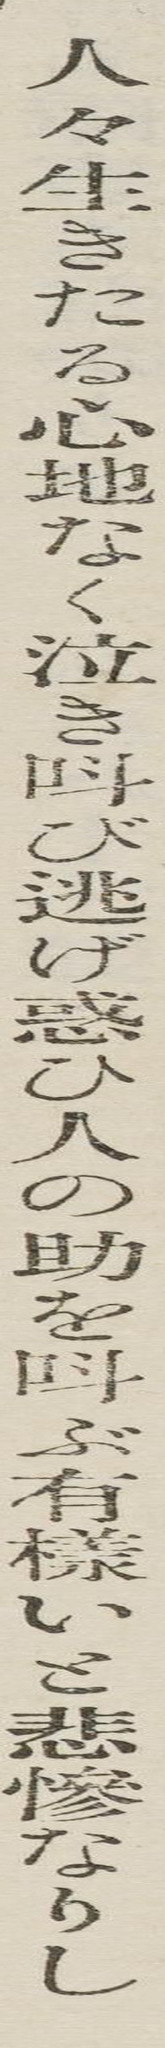人々生きたる心地なく泣き叫び逃げ惑ひ人の助を叫ぶ有様いと悲惨なりし
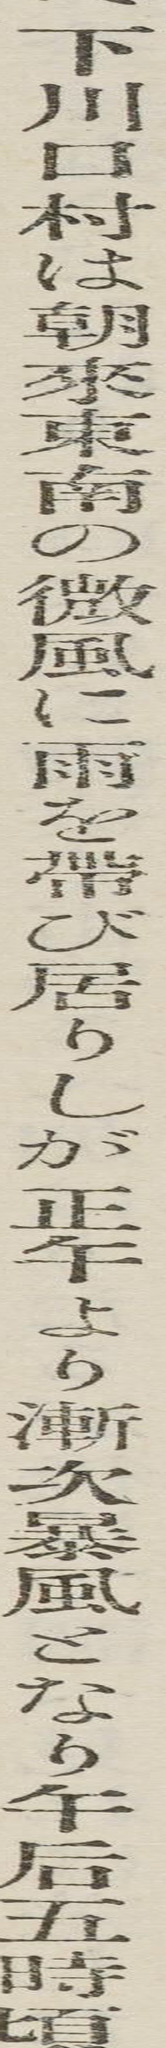下川口村は朝来東南の微風に雨を帯び居りしが正午より漸次暴風となり午后五時頃
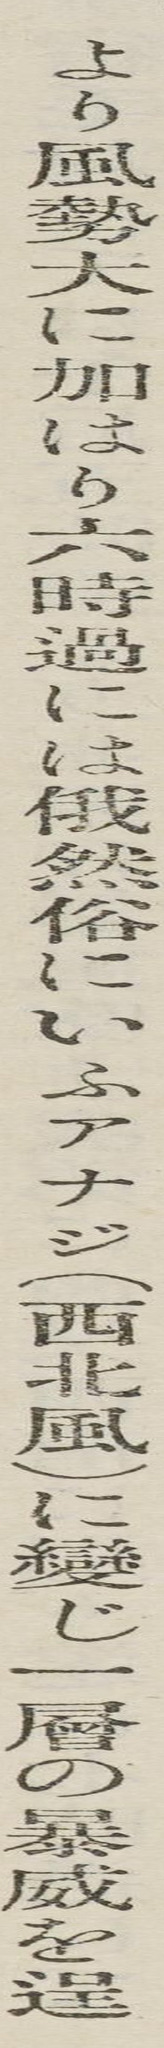より風勢大に加はり六時過には俄然俗にいふアナジに変じ一層の暴威を逞
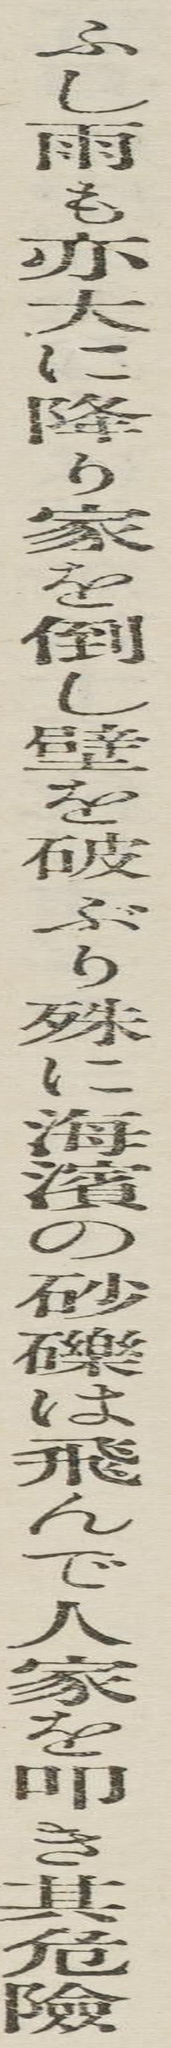ふし雨も亦大に降り家を倒し壁を破ぶり殊に海浜の砂礫は飛んで人家を叩き其危険
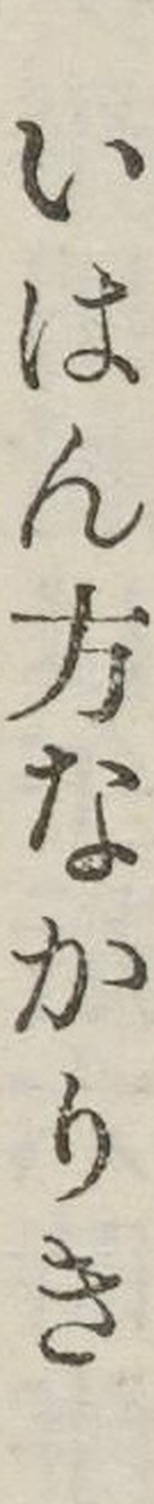いはん方なかりき
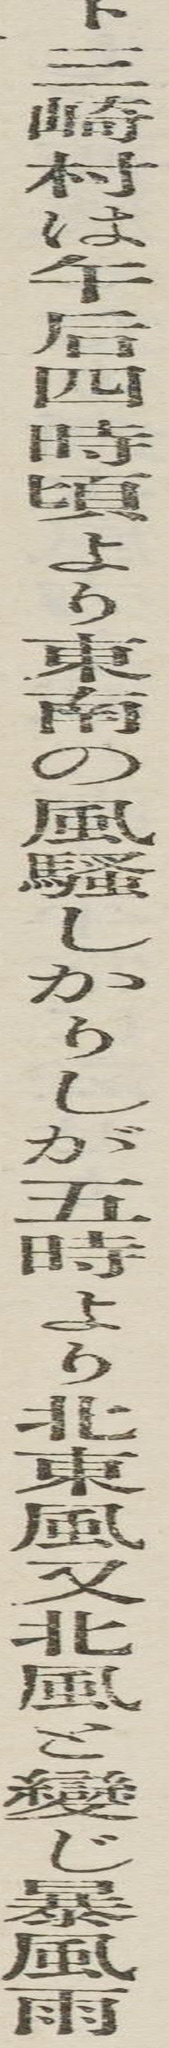三崎村は午后四時頃より東南の風騒しかりしが五時より北東風又北風と変じ暴風雨
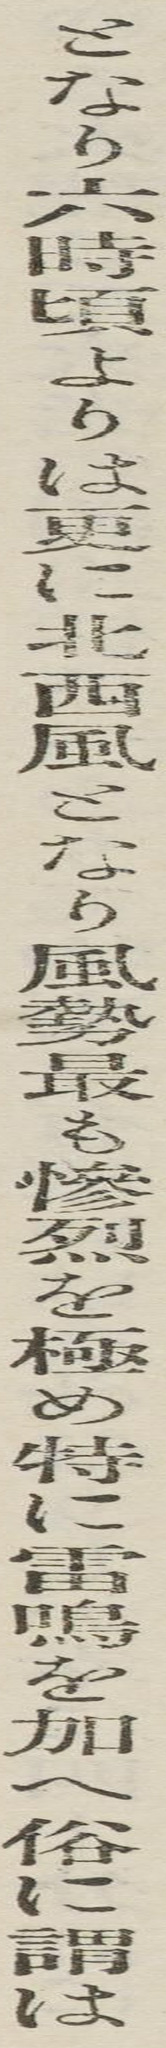となり六時頃よりは更に北西風となり風勢最も惨烈を極め特に雷鳴を加へ俗に謂は

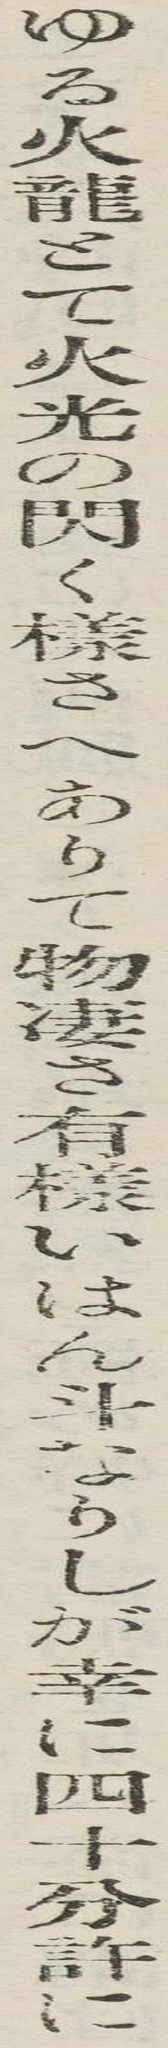ゆる火竜とて火光の閃く様さへありて物凄さ有様いはん斗なりしが幸に四十分許に
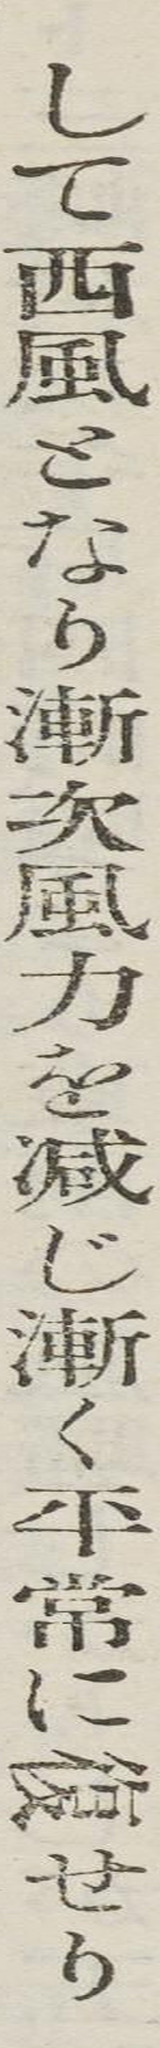して西風となり漸次風力を減じ漸く平常に復せり
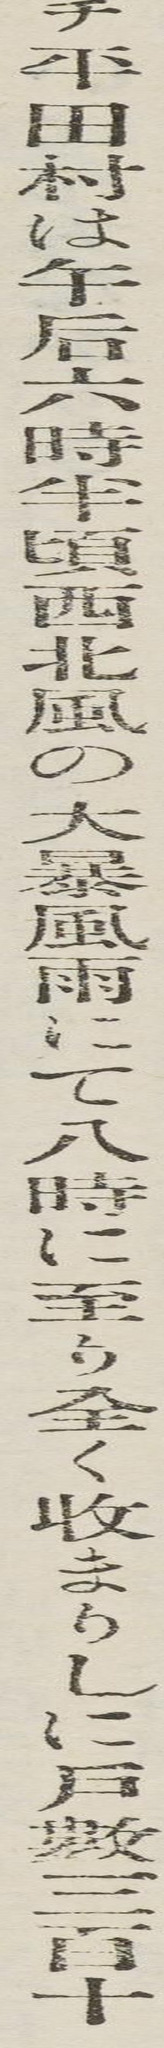平田村は午后六時半頃西北風の大暴風雨にて八時に至り全く収まりしに戸数三百十
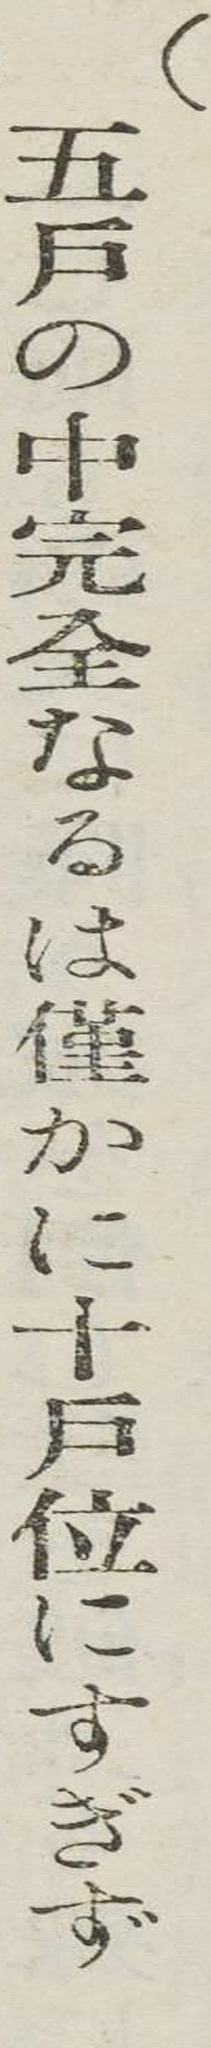五戸の中完全なるは僅かに十戸位にすぎず
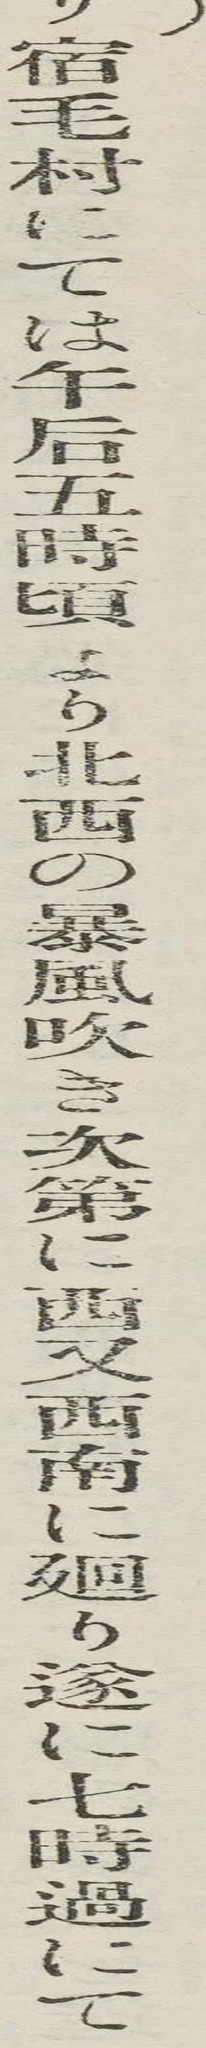宿毛村にては午后五時頃より北西の暴風吹き次第に西又西南に廻り遂に七時過にて
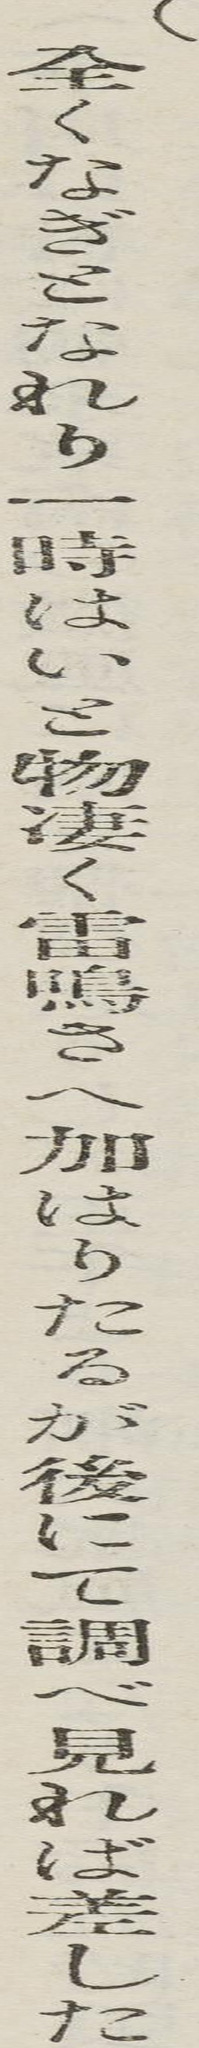全くなぎとなれり一時はいと物凄く雷鳴さへ加はりたるが後にて調べ見れば差した
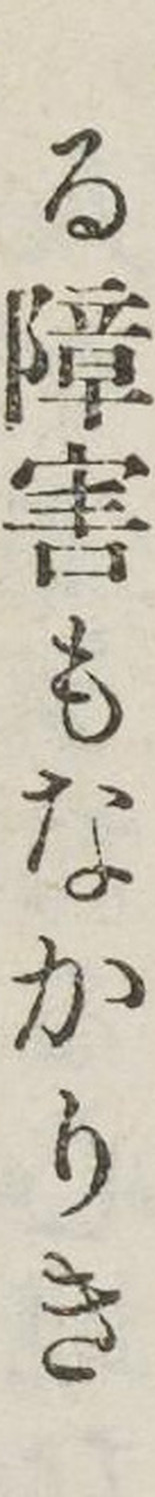る障害もなかりき
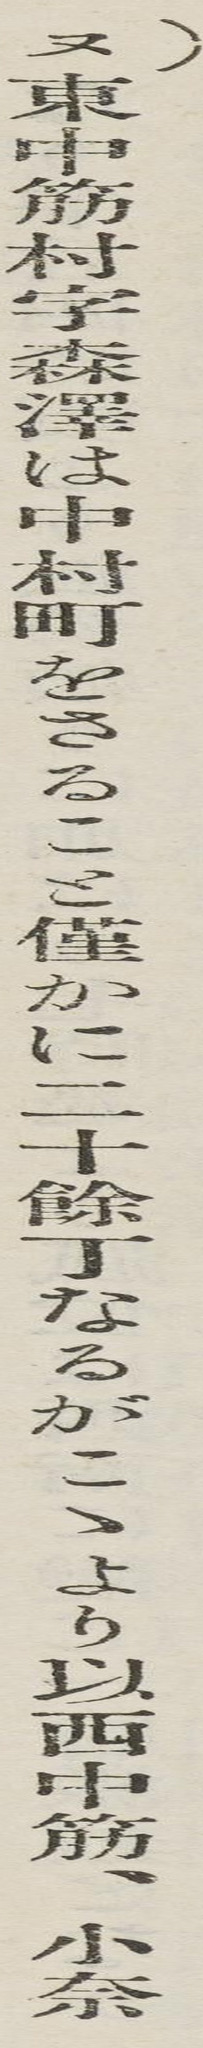東中筋村字森澤は中村町をさること僅かに二十余丁なるがこゝより以西中筋、小奈
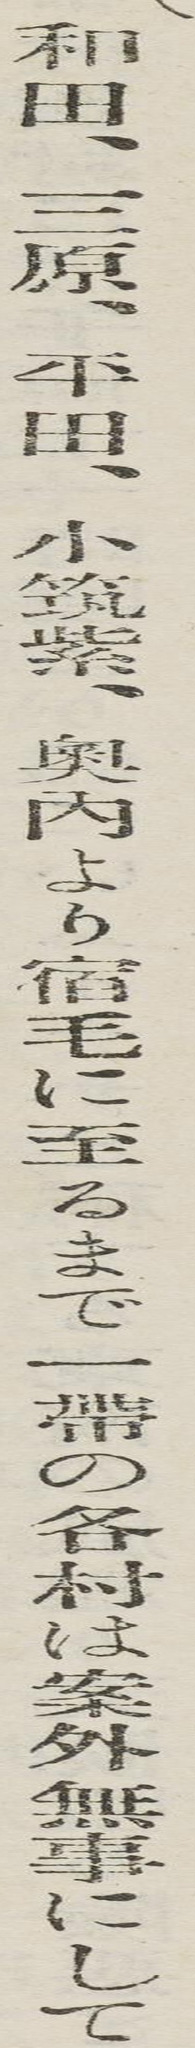和田、三原、平田、小筑紫、奥内より宿毛に至るまで一帯の各村は案外無事にして
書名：土佐古今ノ地震
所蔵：東京大学地震研究所図書室 Earthquake Research Institute Library, The University of Tokyo, JAPAN
